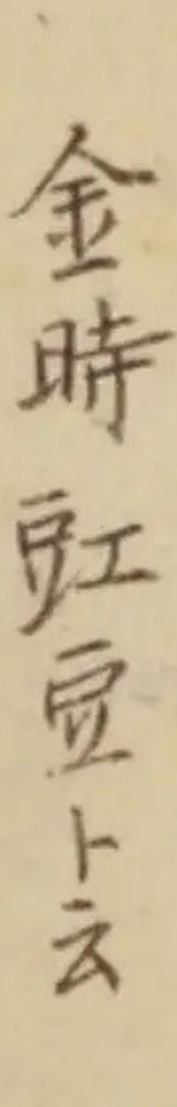金時豇豆と云

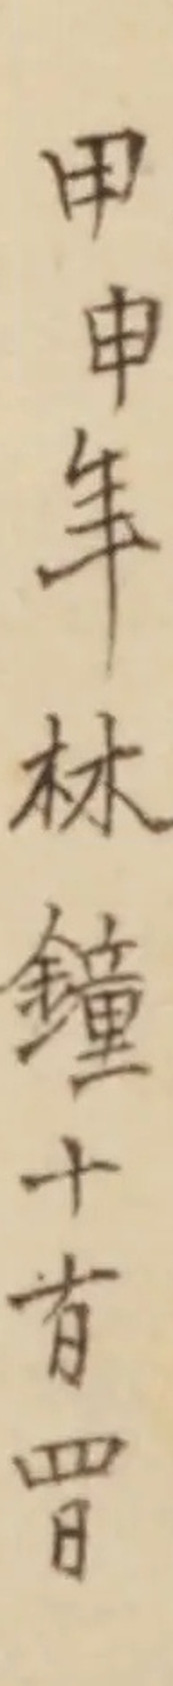甲申年林鐘十有四日
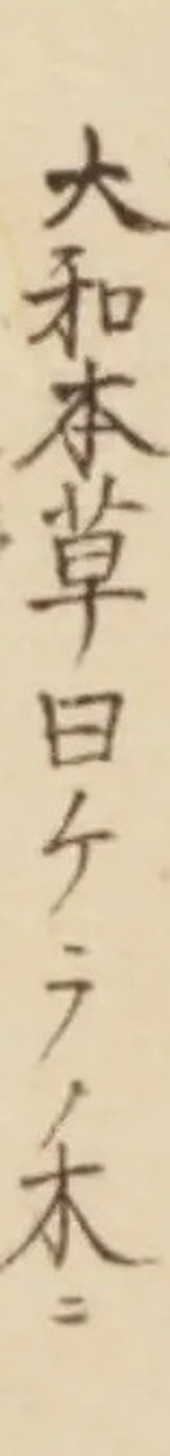大和本草曰けらの木に
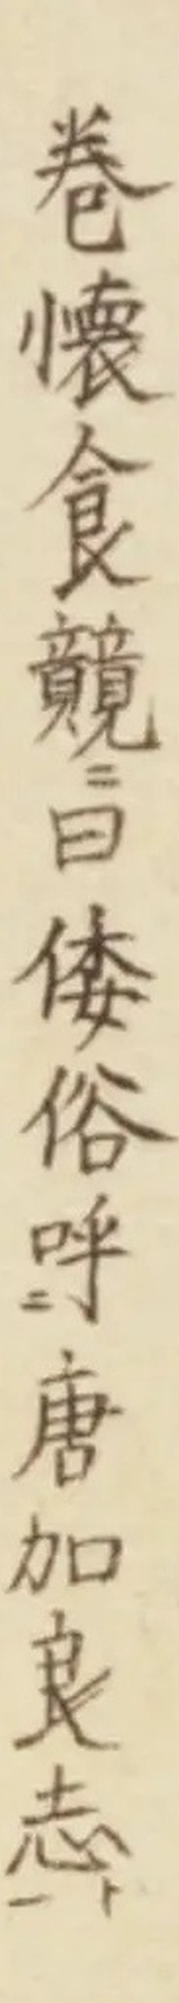巻懐食競に曰倭俗呼唐加良志と
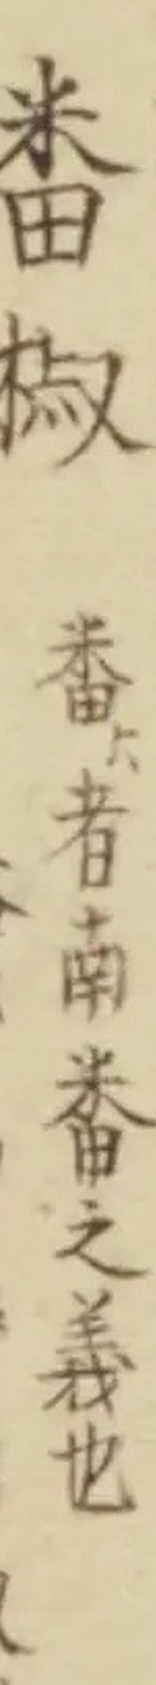番椒番とは者南番之義也
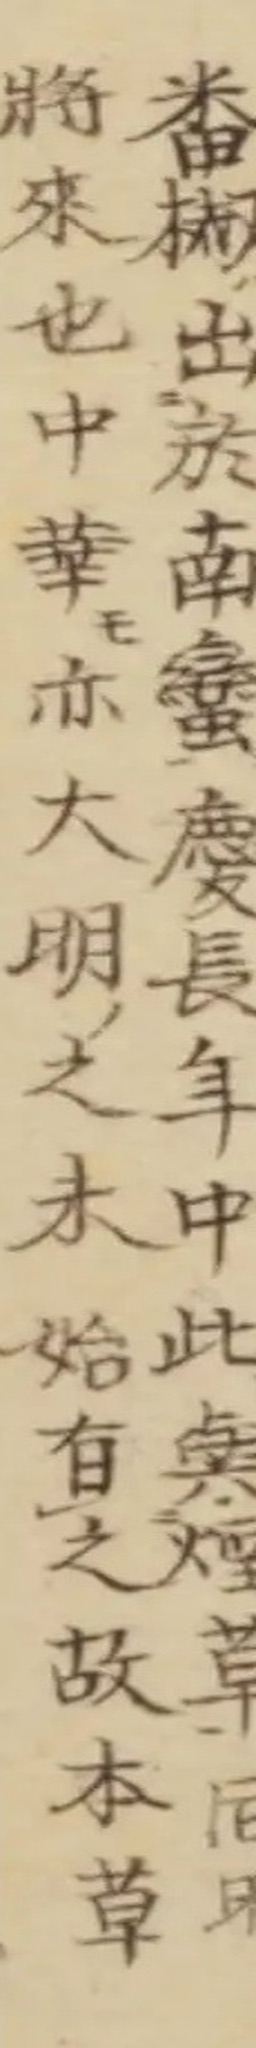將來也中華も亦大明之未始有之故本草

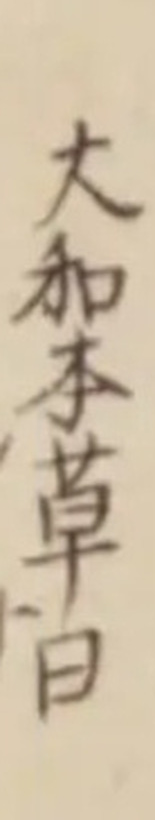大和本草曰
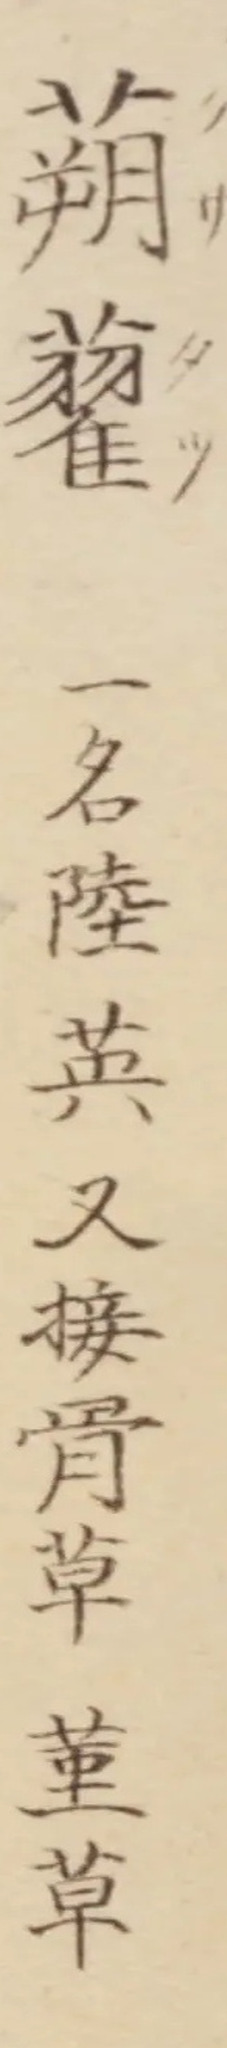蒴藋一名陸英又接骨草菫草
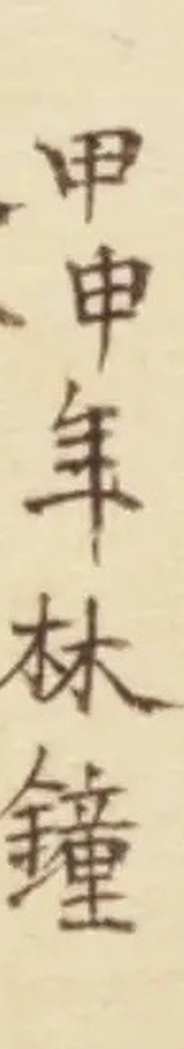甲申年林鐘
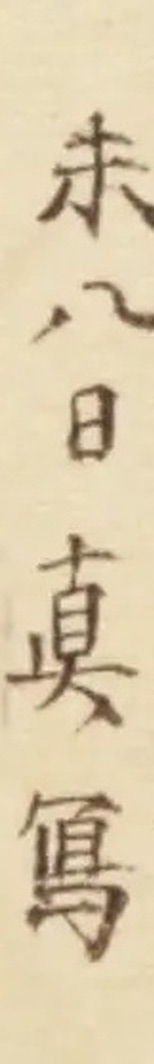未八日真寫
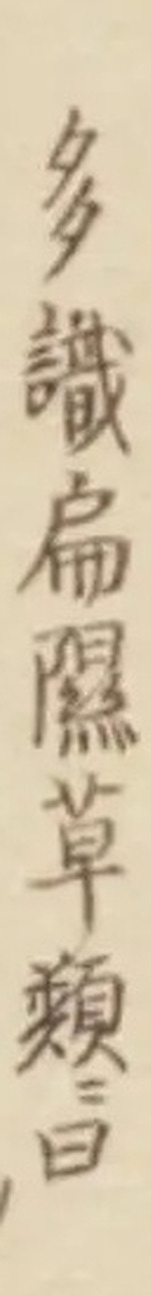多識扁隰草類ニ曰
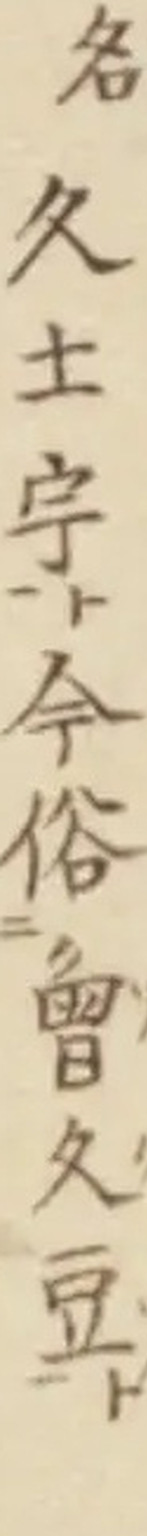名久土宇と今俗曽久豆と
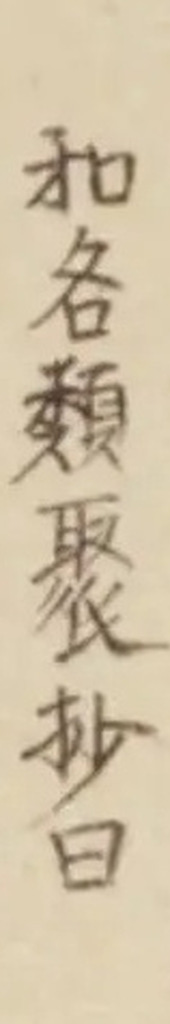和名類聚抄曰
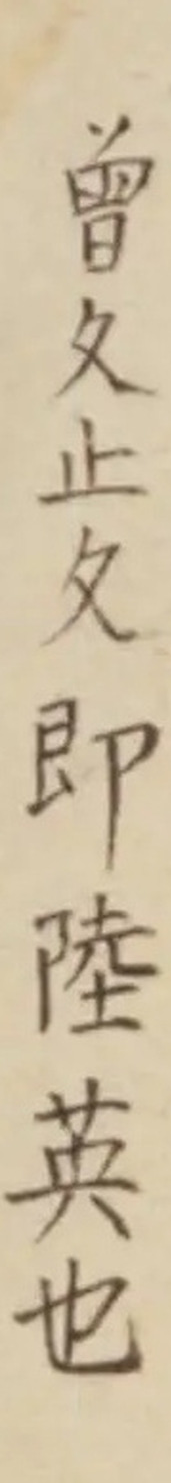曽久止夂即陸英也
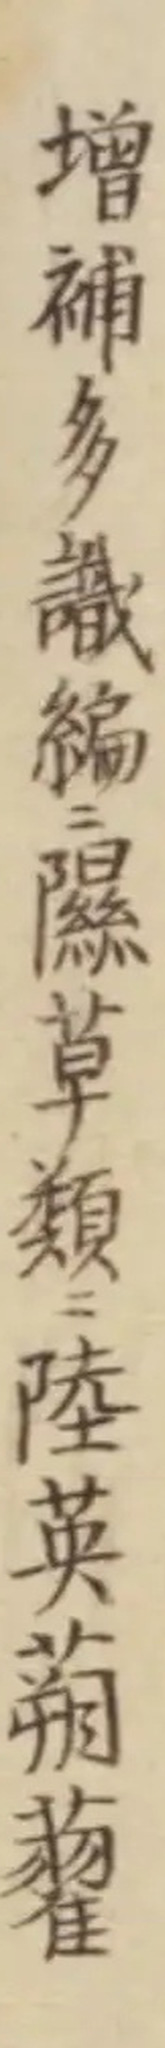増補多識編に隰草類に陸英蒴藋

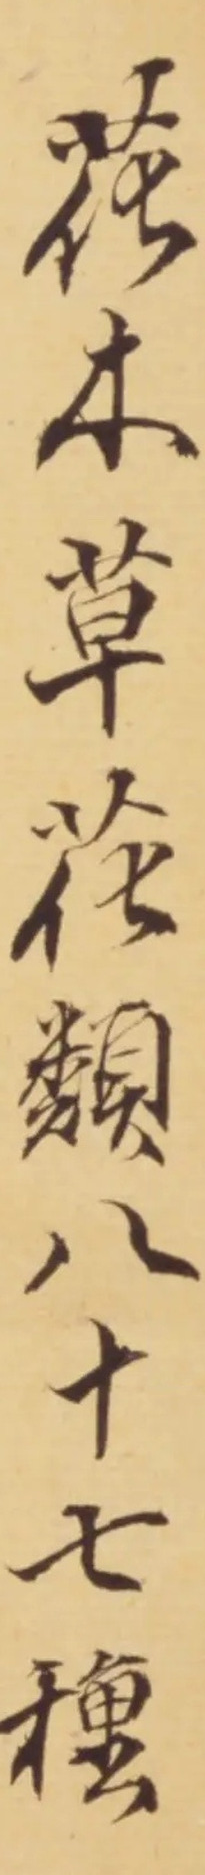花木草花類八十七種
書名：梅園草木花譜夏之部. 2
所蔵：国立国会図書館 National Diet Library, JAPAN
